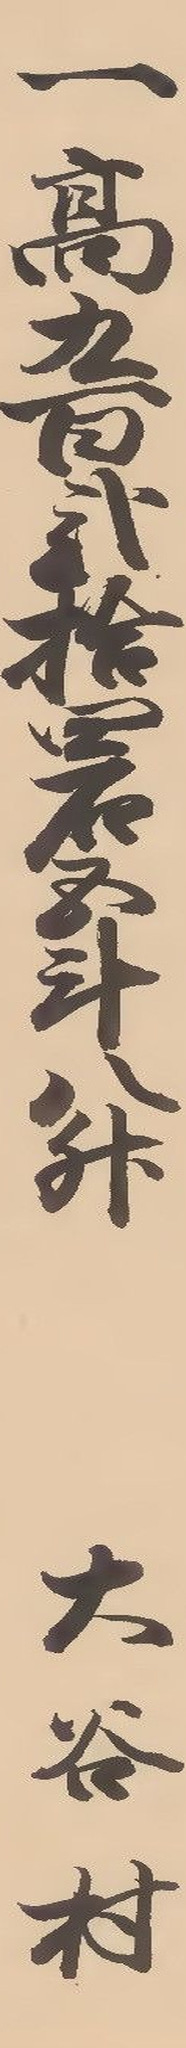一高九百弐拾四石五斗八升大谷村
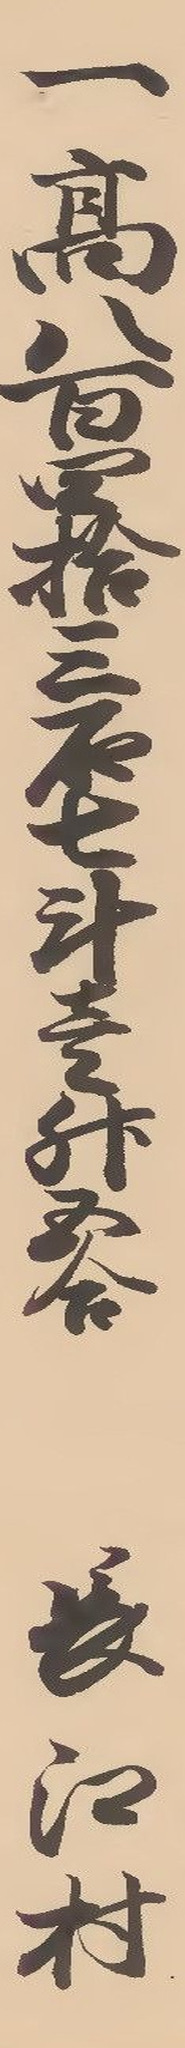一高八百四拾三石七斗壱升五合長江村
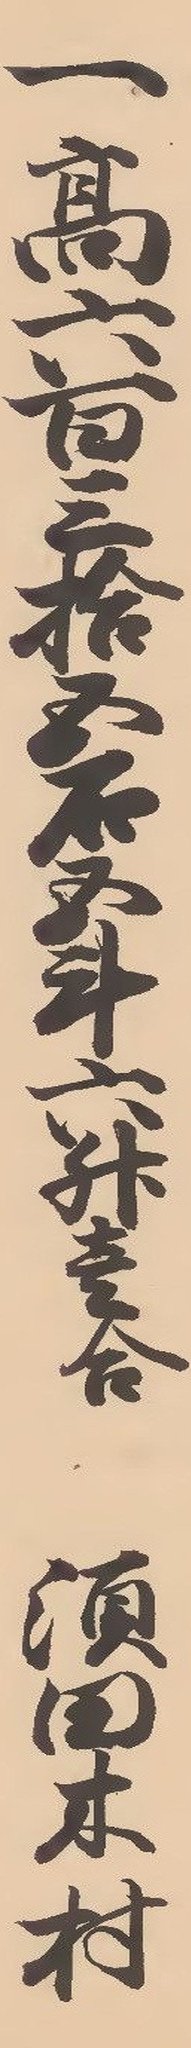一高六百三拾五石五斗六升壱合須田木村
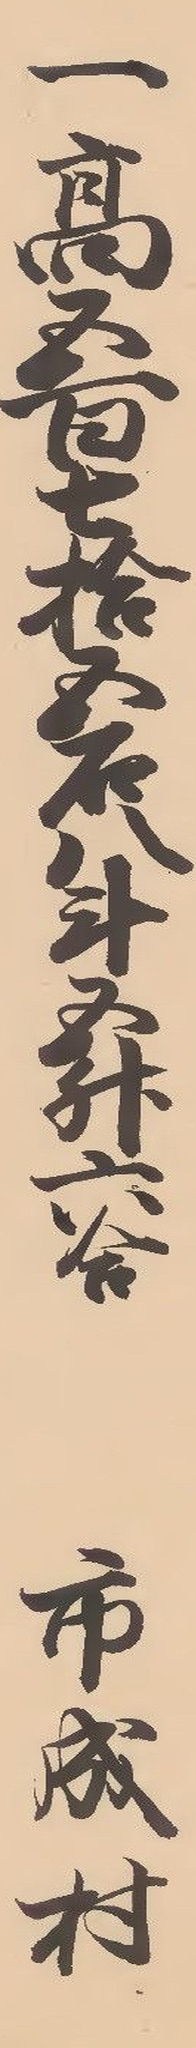一高五百七拾五石八斗五升六合市成村
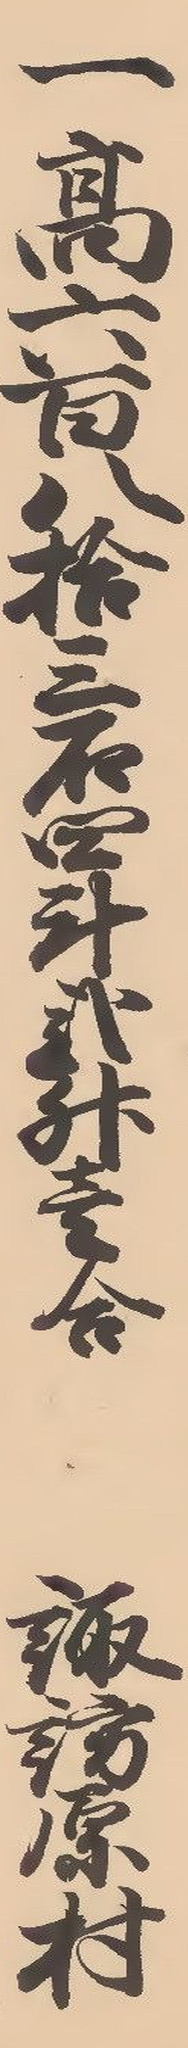一高六百八拾三石四斗弐升壱合諏訪原村
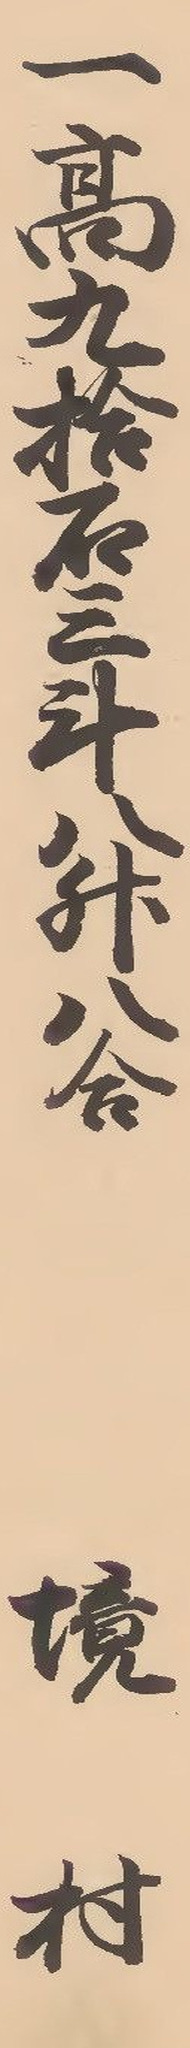一高九拾石三斗八升八合境村

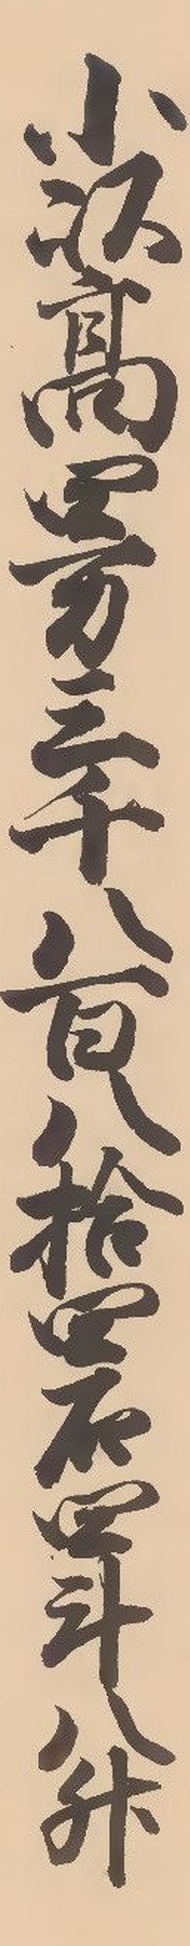小以高四万三千八百八拾四石四斗八升
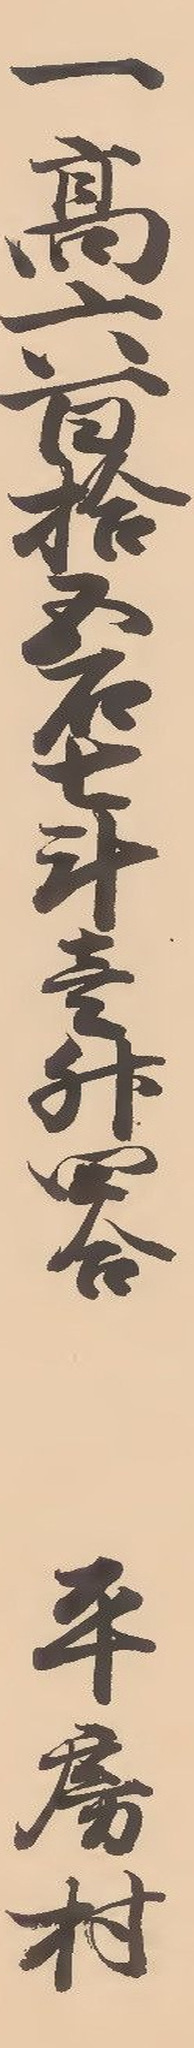一高六百拾五石七斗壱升四合平房村
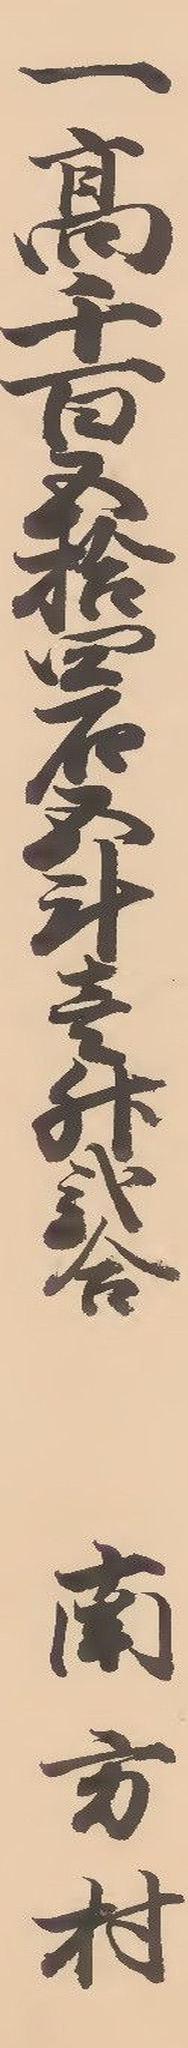一高千百五拾四石五斗壱升弐合南方村

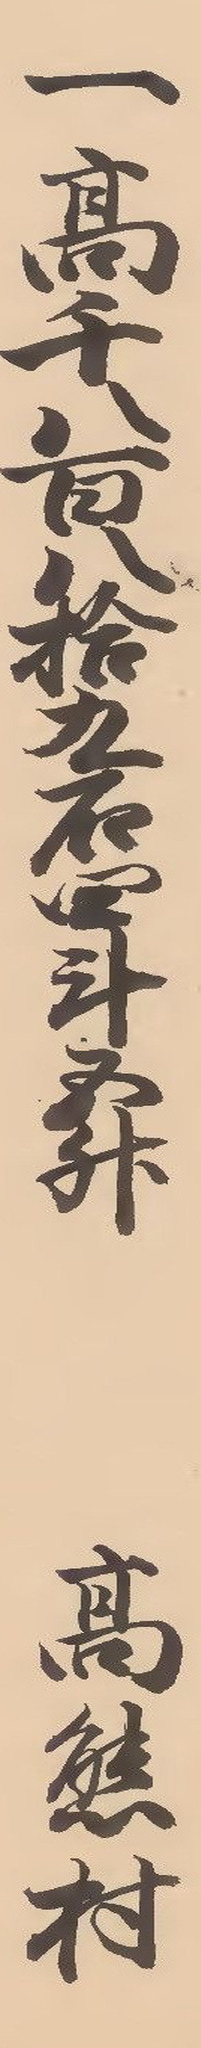一高千八百八拾九石四斗五升高熊村
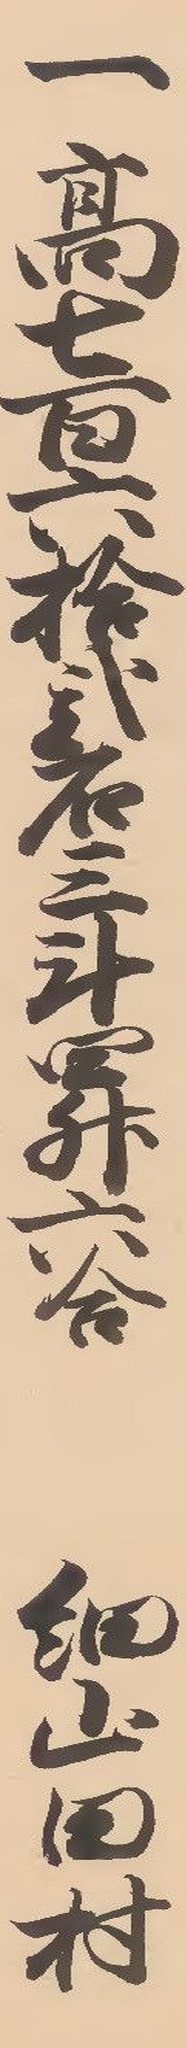一高七百六拾弐石三斗四升六合細山田村
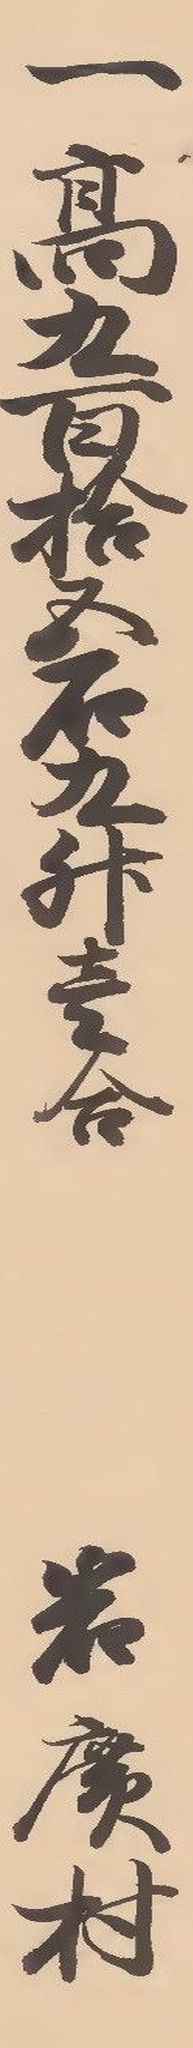一高九百拾五石九升壱合岩広村
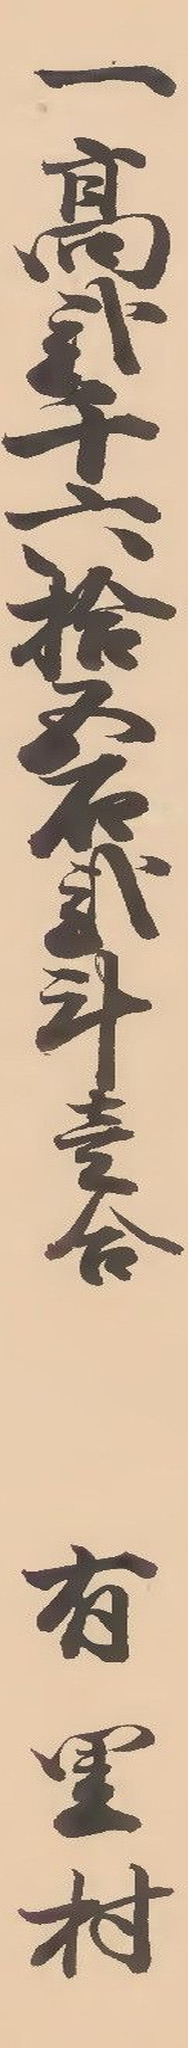一高弐千六拾五石弐斗壱合有里村
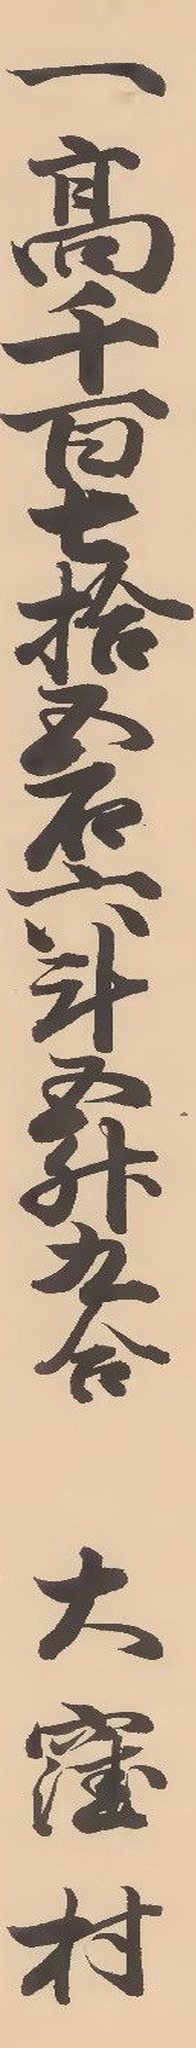一高千百七拾五石六斗五升九合大窪村
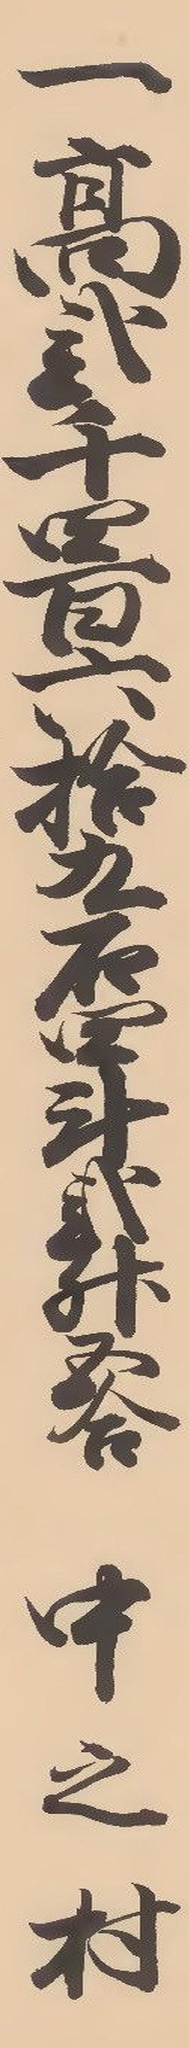一高弐千四百六拾九石四斗弐升五合中之村
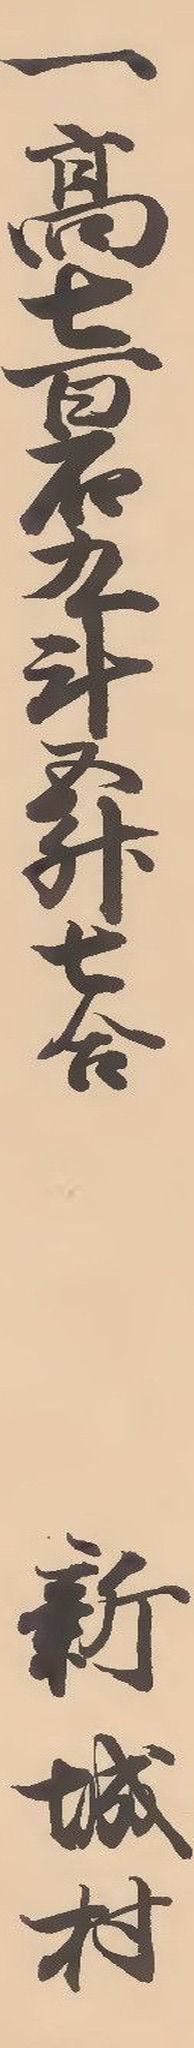一高七百石九斗五升七合新城村
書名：大隅国郷帳
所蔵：国立公文書館 National Archives of Japan
